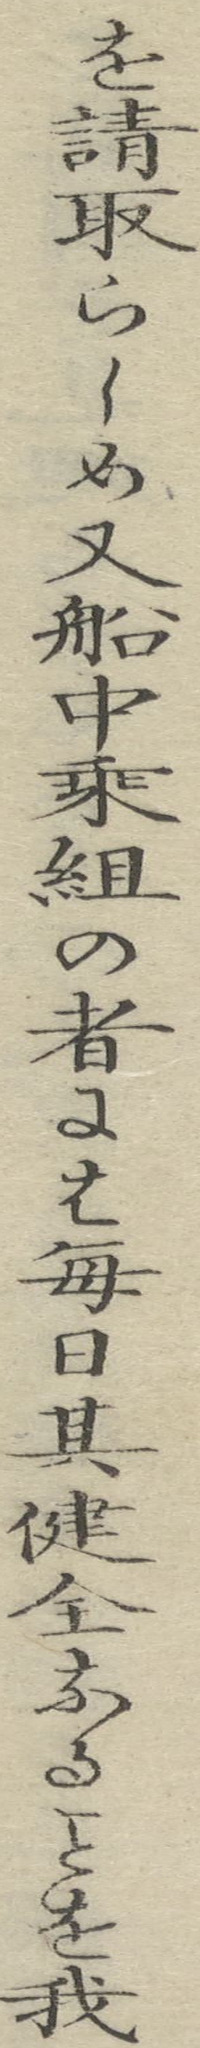を請取らしめ又船中乗組の者には毎日其健全なることを我
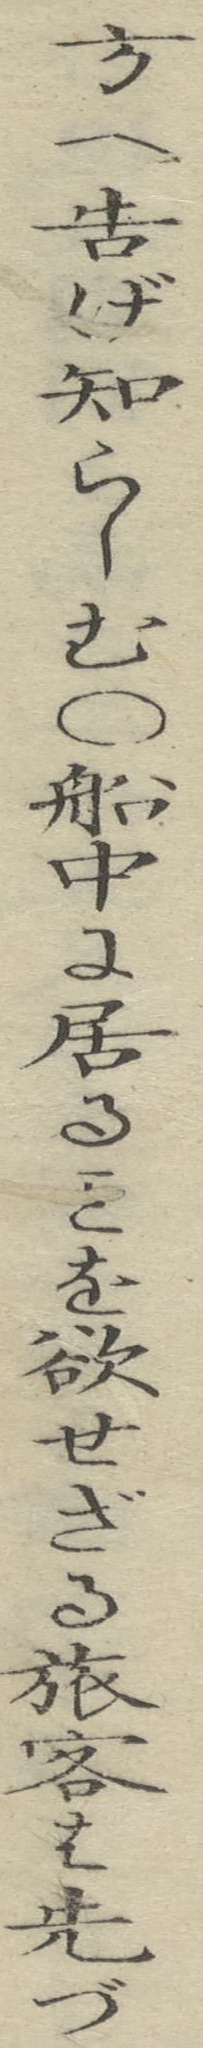方へ告げ知らしむ〇船中に居ることを欲せざる旅客は先づ
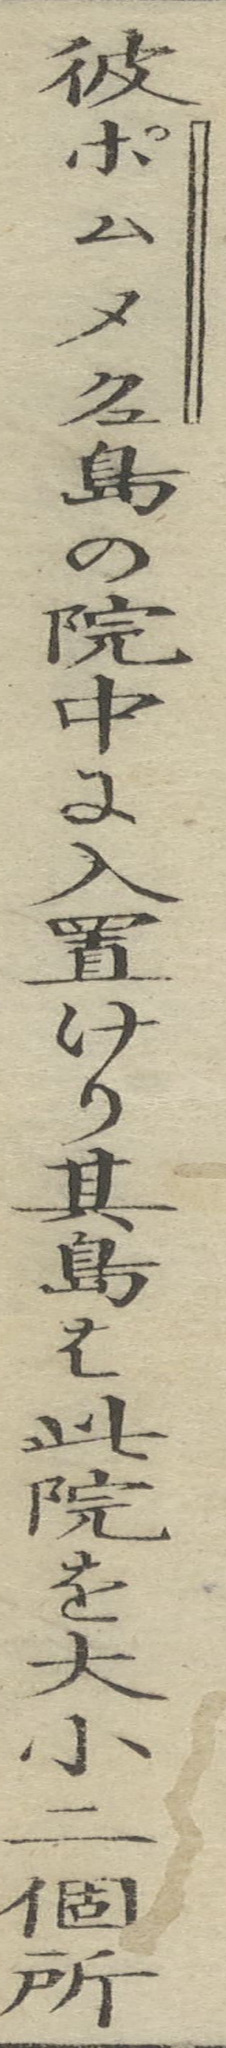彼ポムメクェ島の院中に入置けり其島は此院を大小二個所

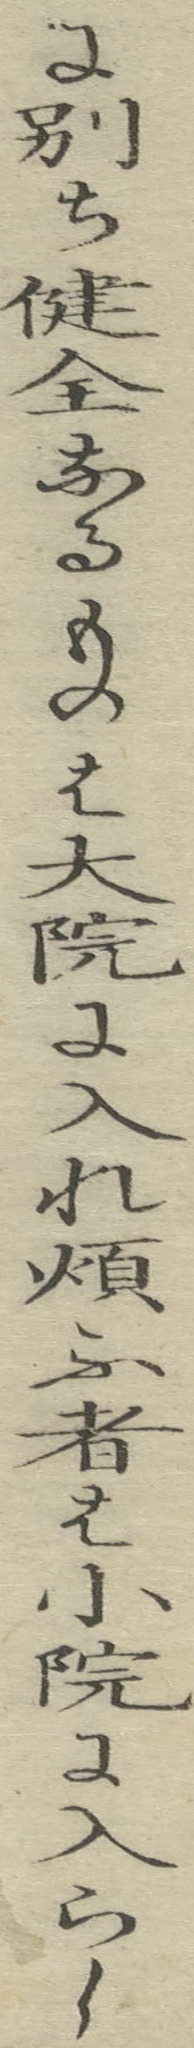に別ち健全なるものは大院に入れ煩ふ者は小院に入らし
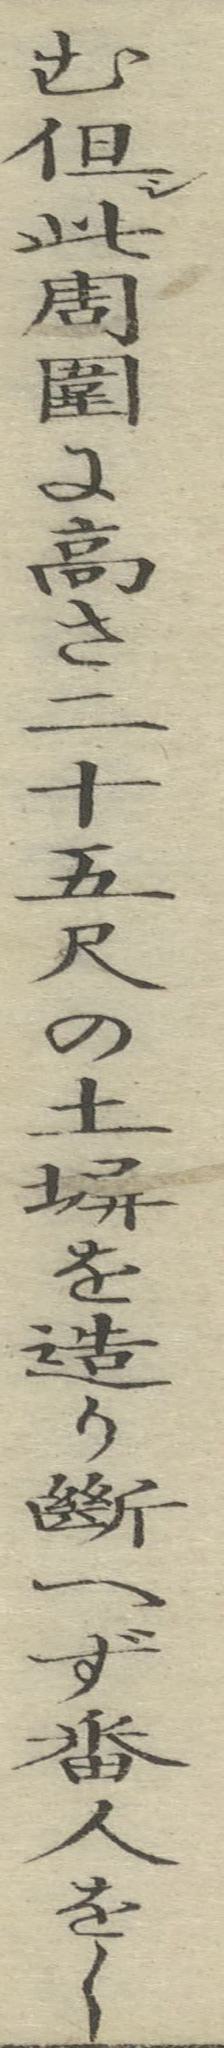む但此周圍に高さ二十五尺の土塀を造り斷へず番人をし
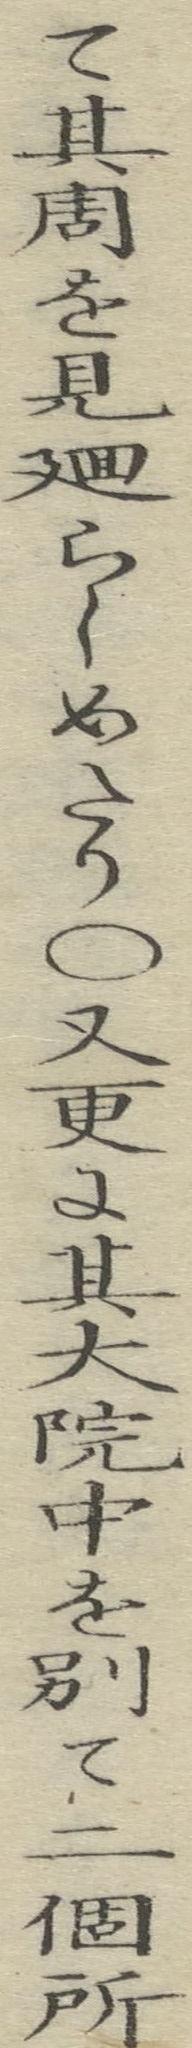て其周を見廻らしめたり〇又更に其大院中を別て二個所
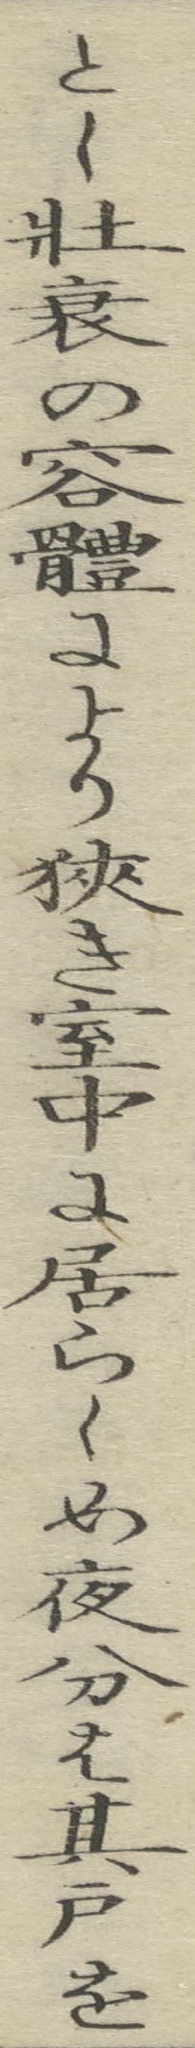とし壮衰の容體により狭き室中に居らしめ夜分は其戸を
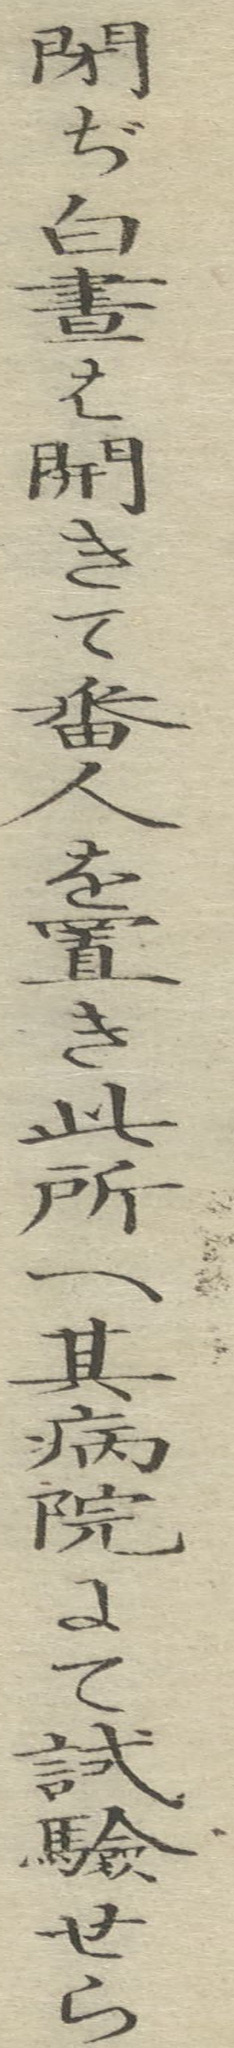閉ぢ白晝は開きて番人を置き此所へ其病院にて試驗せら
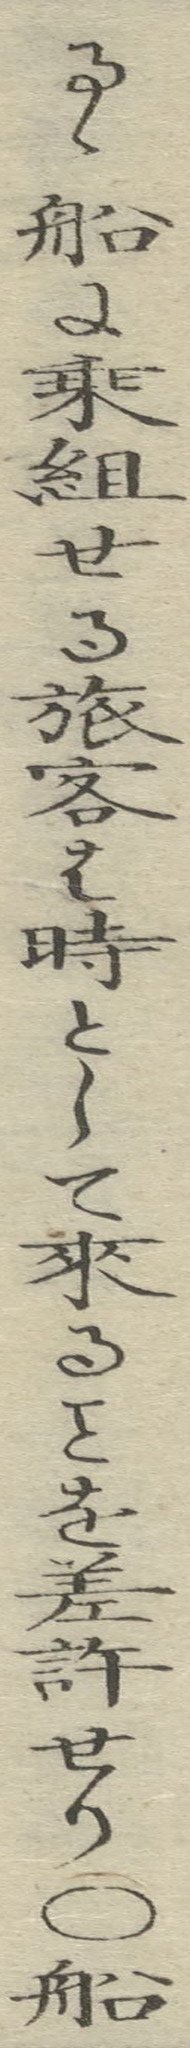るゝ船に乗組せる旅客は時として來ることを差許せり〇船
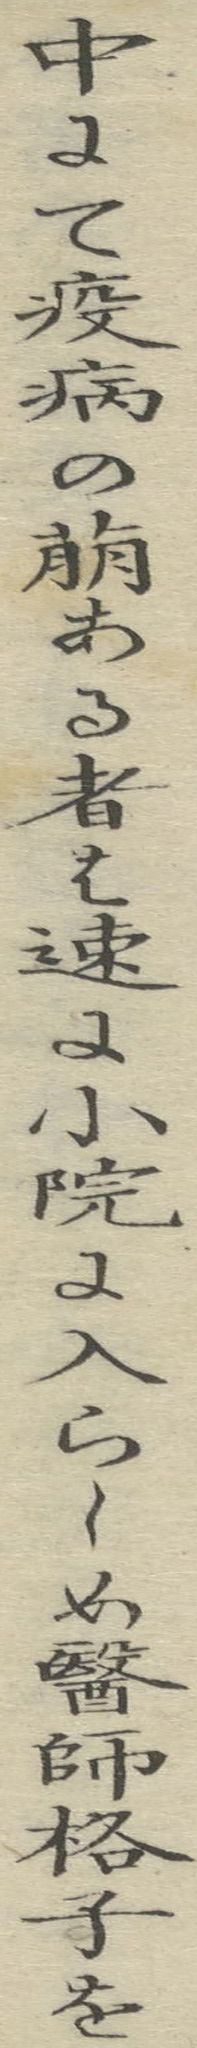中にて疫病の萌ある者は速に小院に入らしめ醫師格子を
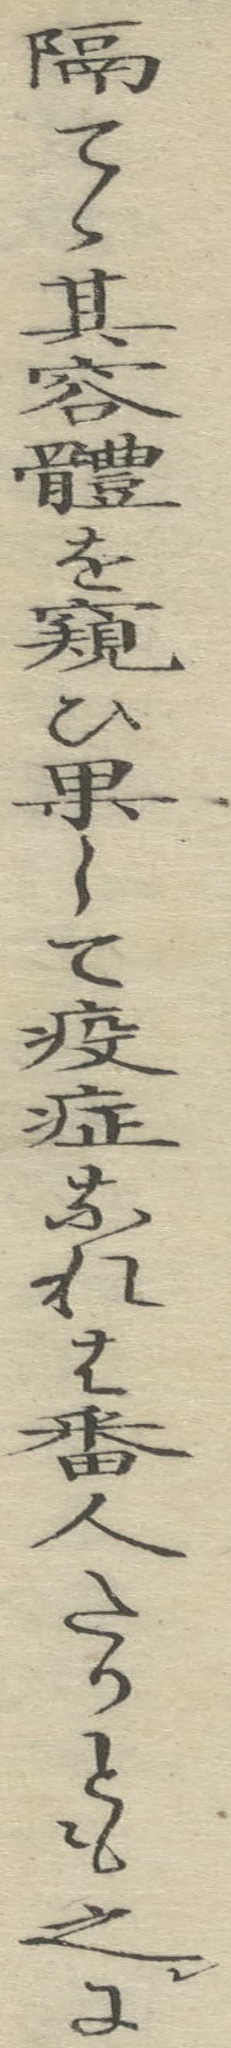隔てゝ其容體を窺ひ果して疫症なれは番人たりとも之
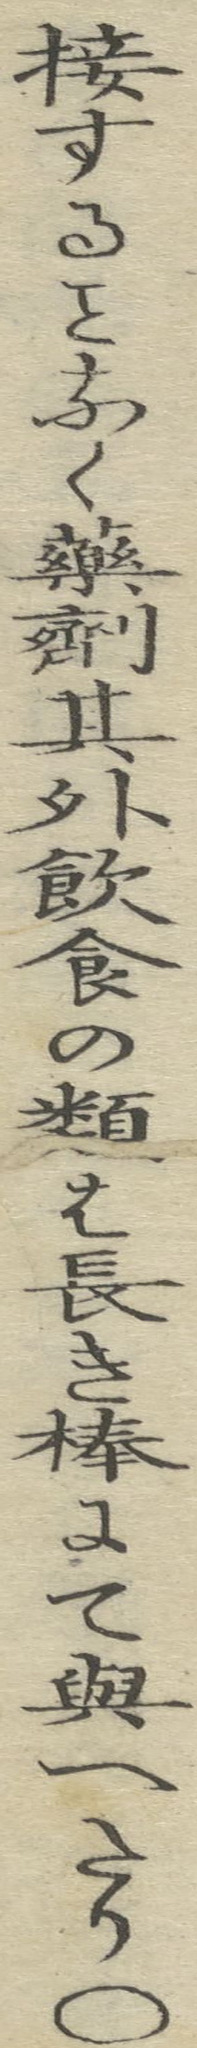接することなく藥劑其外飲食の類は長き棒にて與へたり〇
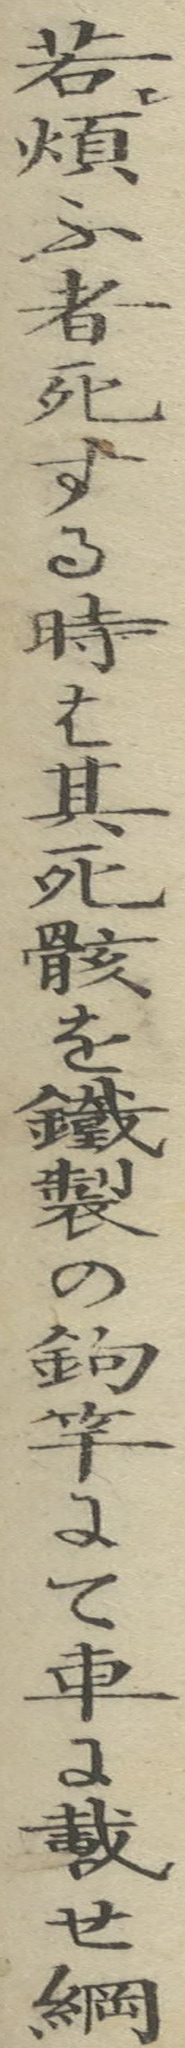若煩ふ者死する時は其死骸を鐵製の鉤竿にて車に載せ網
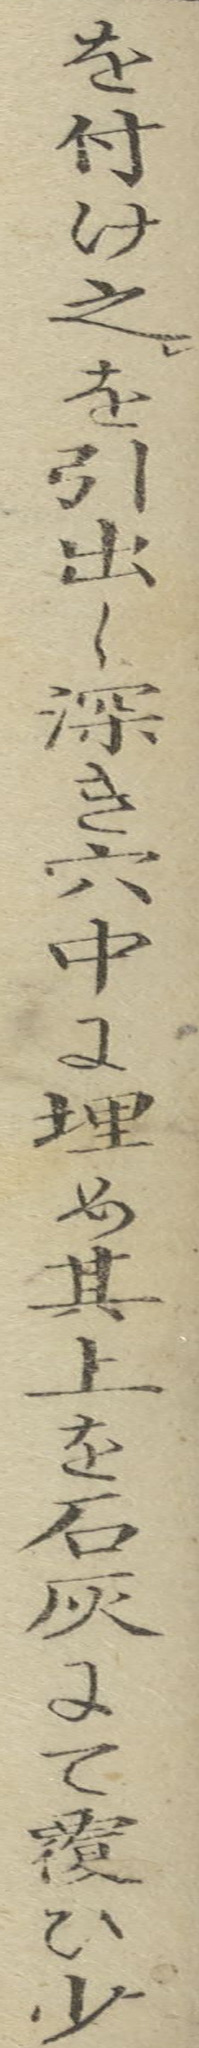を付け之引出し深き穴中に埋め其上を石灰にて覆ひ少
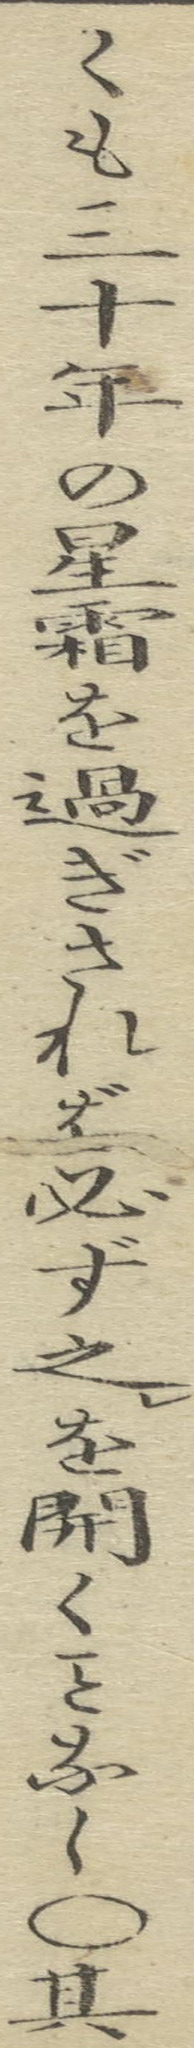くも三十年の星霜を過ぎされば必ず之開くことなし〇其
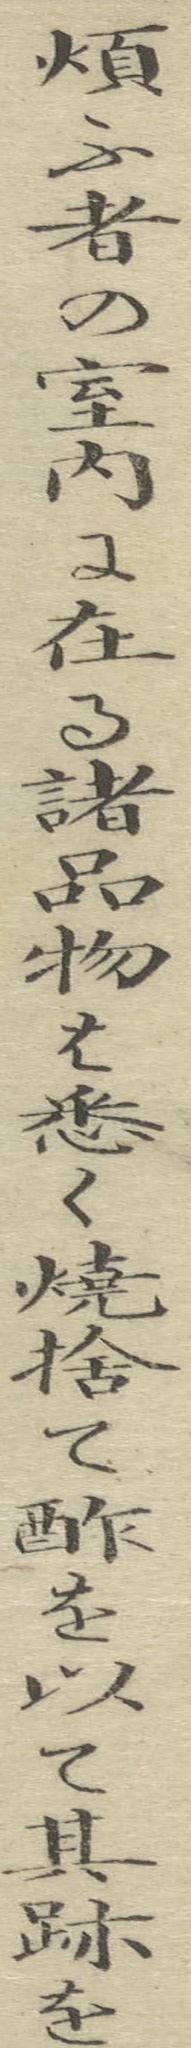煩ふ者の室内に在る諸品物は悉く焼捨て酢を以て其跡を
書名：官版疫毒預防説　全
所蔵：東京大学総合図書館 General Library in the University of Tokyo, JAPAN
